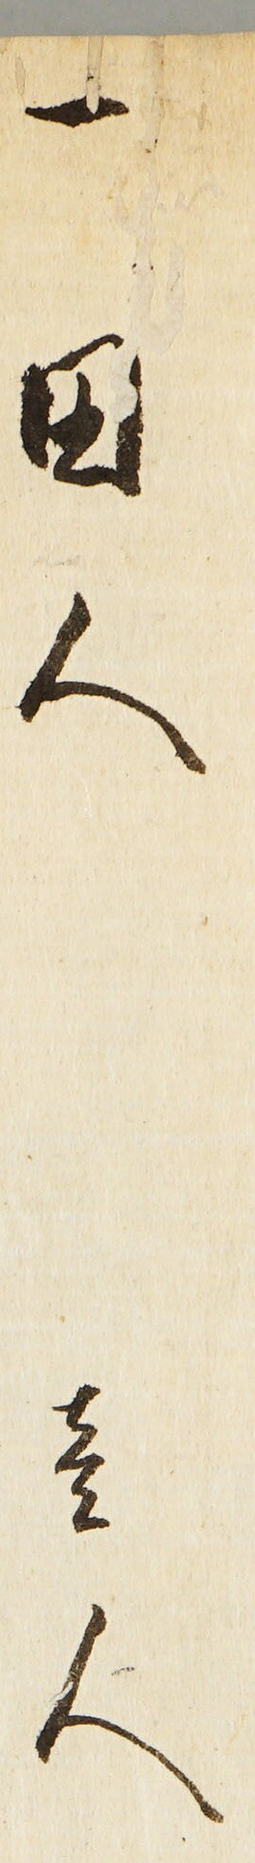一田人壱人
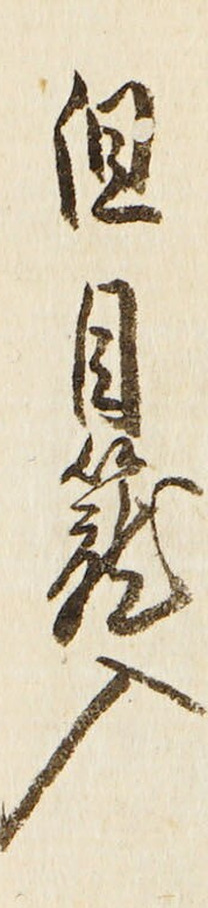但目籠入
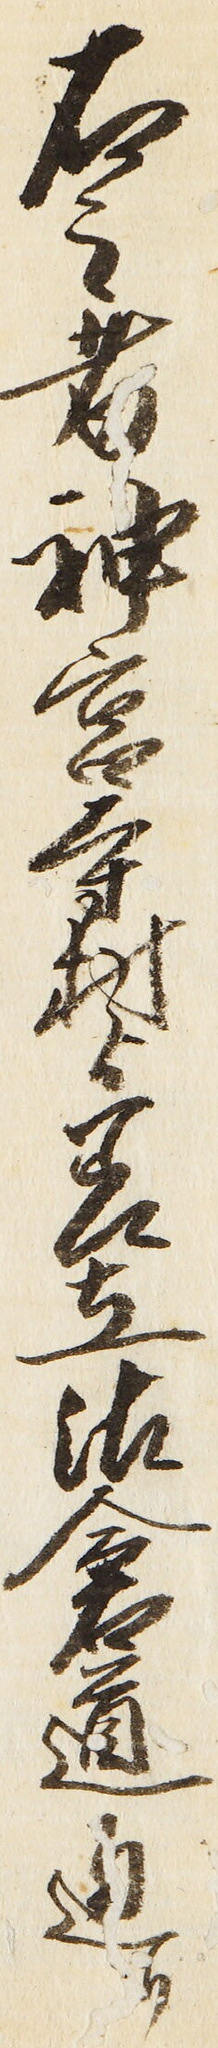右之者神宮寺村ゟ差立佐倉道通り
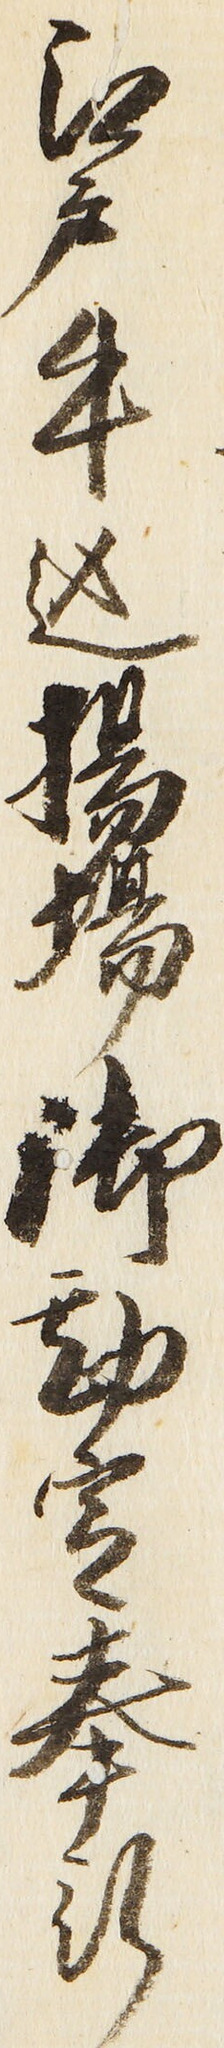江戸牛込揚場御勘定奉行
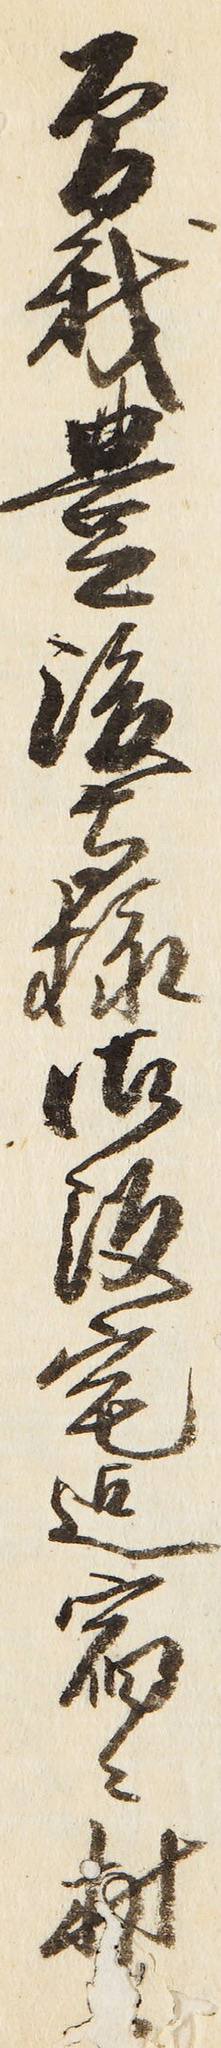曽我豊後守様御役宅迄宿々村々
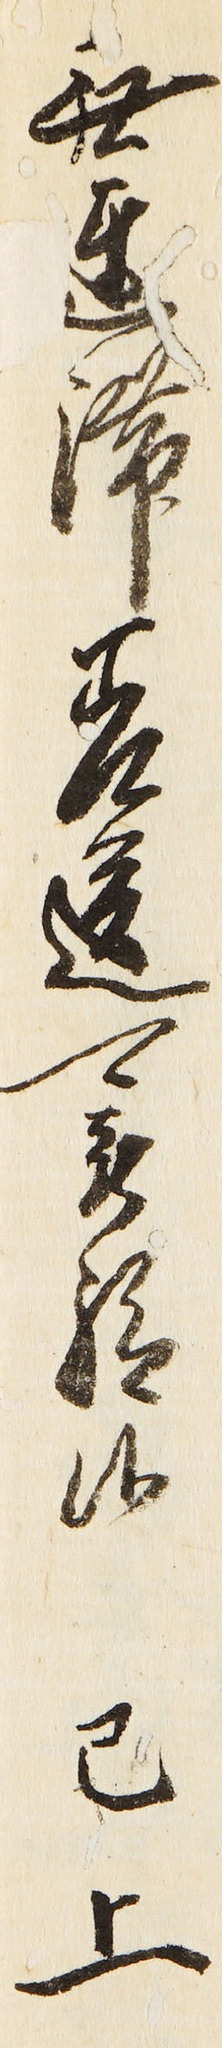無遅滞差送可被給候已上
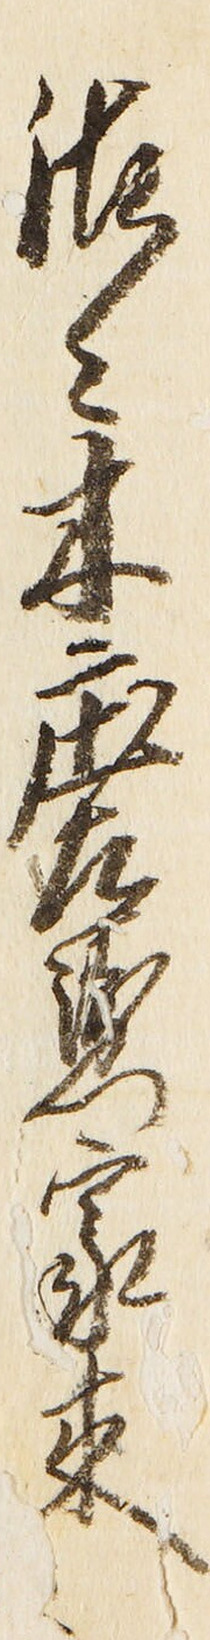佐々木庄左衛門家来
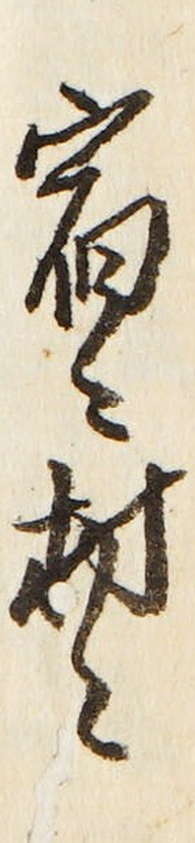宿々村々
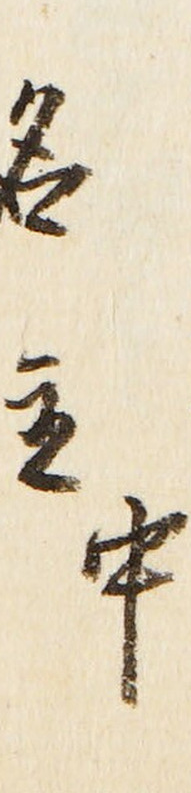名主中

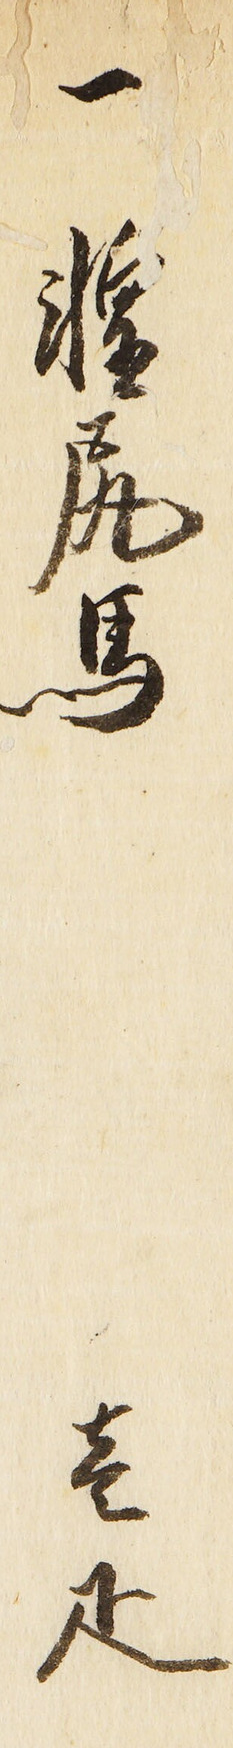一軽尻馬壱疋
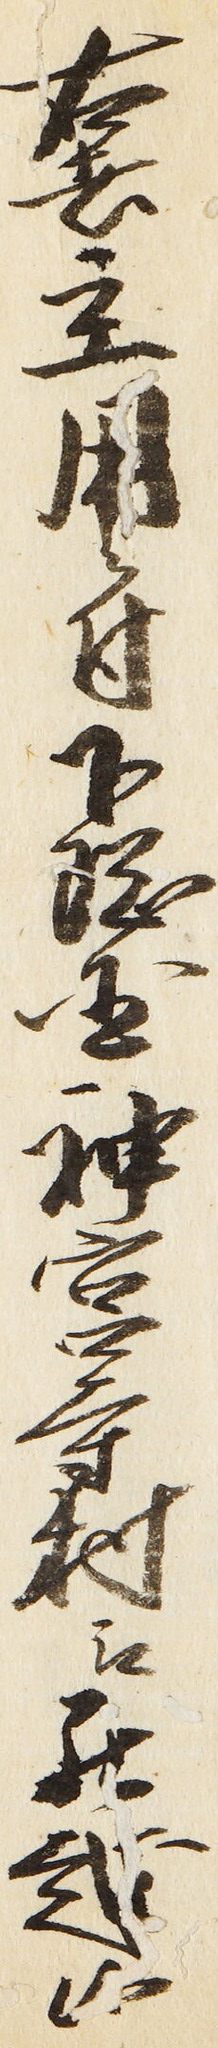右者立用ニ付下総国神宮寺村江罷越候
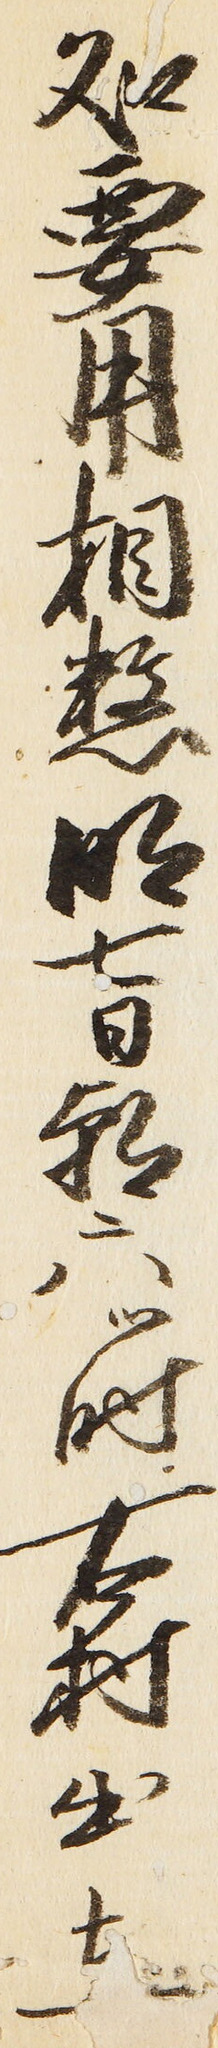処要用相整明七日朝六ツ時右村出立
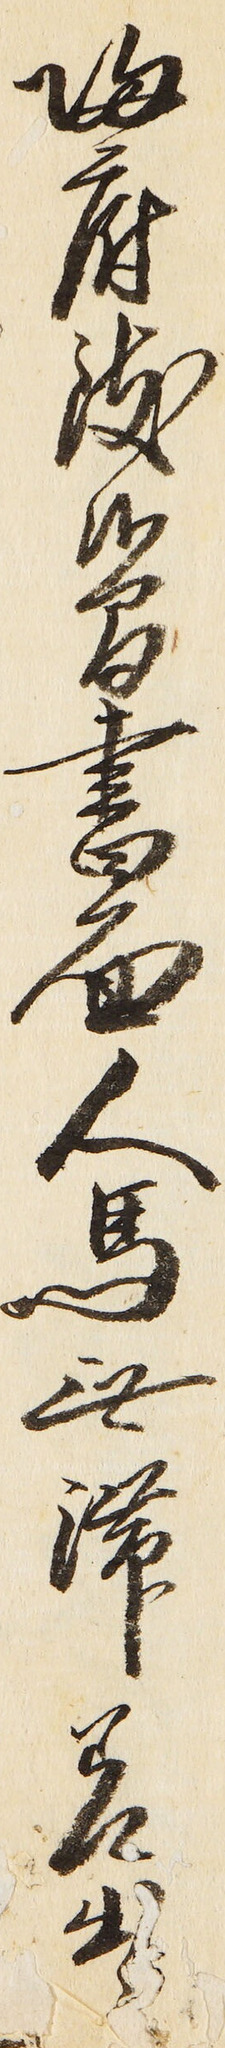帰府致候間書面人馬無滞差出
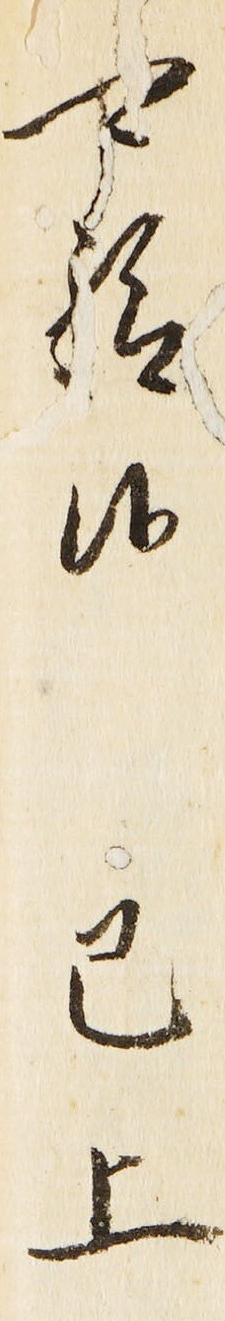可給候已上
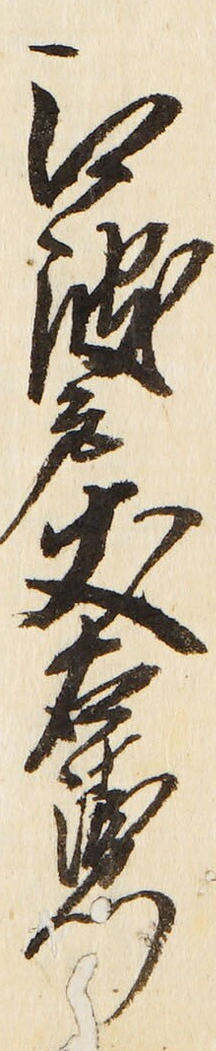江波戸丈右衛門
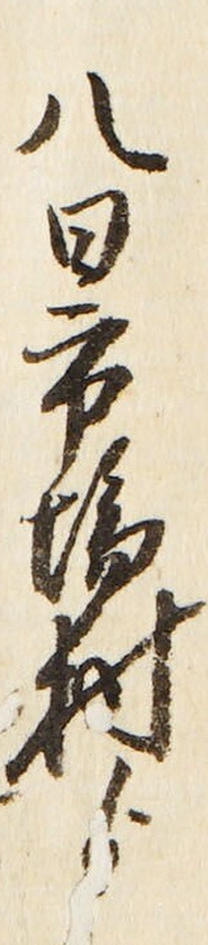八日市場村ゟ
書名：難船一件記録
